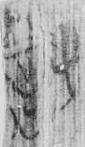○（察）
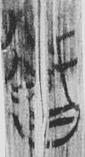智（知）
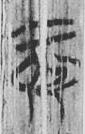而
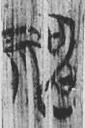神
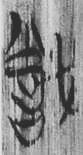○（察）
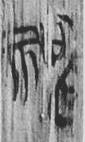神
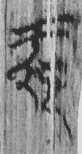而
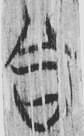同
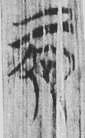而
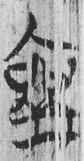僉
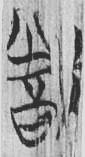○（察）
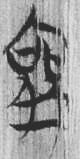僉
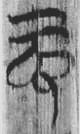而
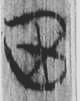困
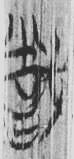○（察）
